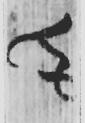氒
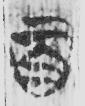百
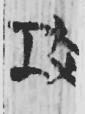攻
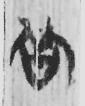向
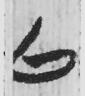㠯（以）
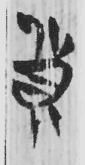貨
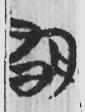旬
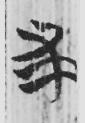求
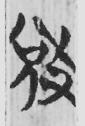敓（說）
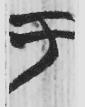于
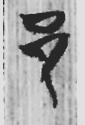邑
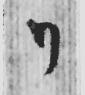人
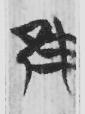隹
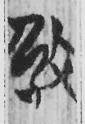{弓攴}
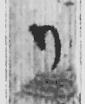人
